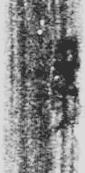或
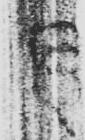長
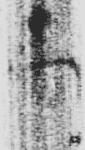之
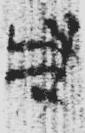凡
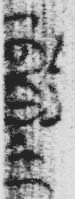○（動）
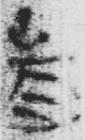眚（性）
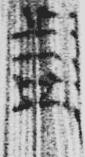者
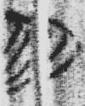勿（物）
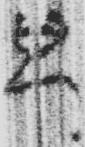也
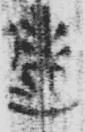逆
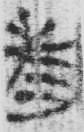眚（性）
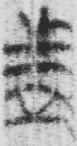者
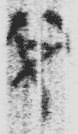兌（悅）
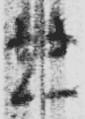也
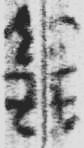○（實）
